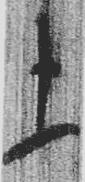土（杜）
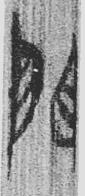門
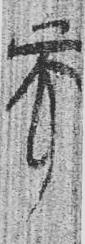而
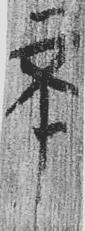不
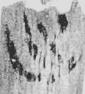出
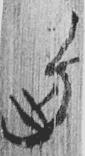此
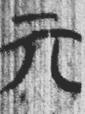亓（其）
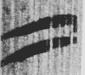二
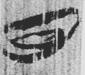回
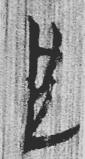也
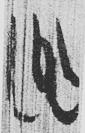州
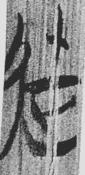徒
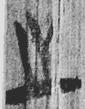之
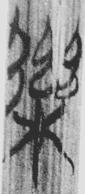樂
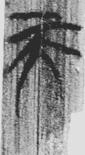而
